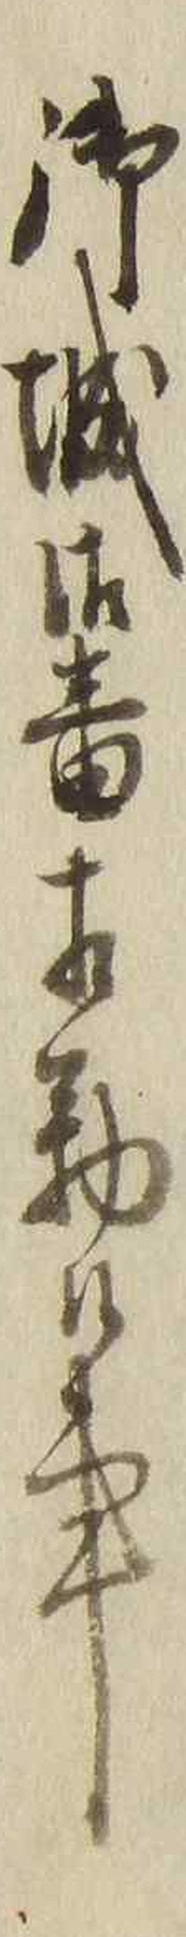御城御番相勤候事

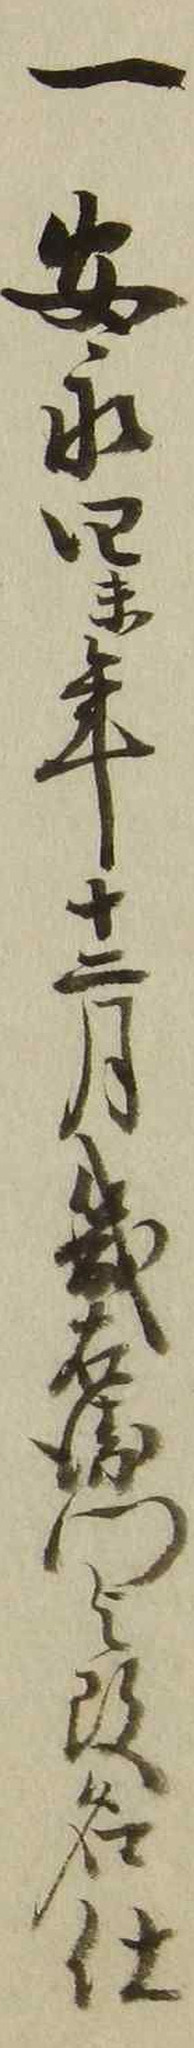一安永四未年十二月幾右衛門と改名仕
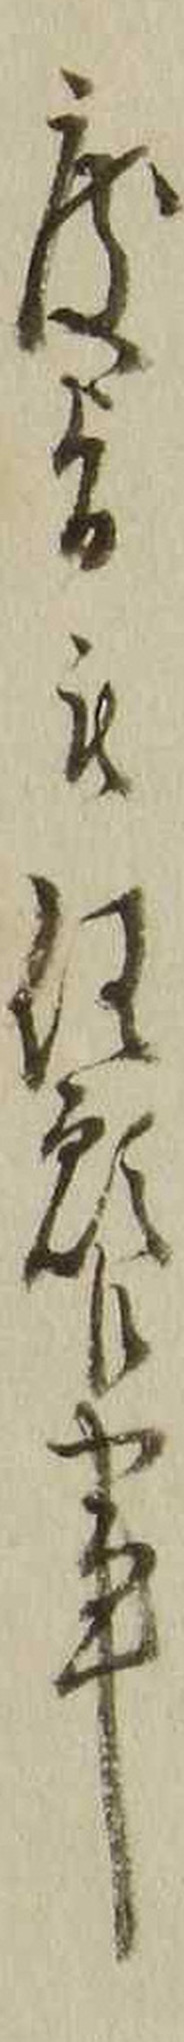度旨被任願候事
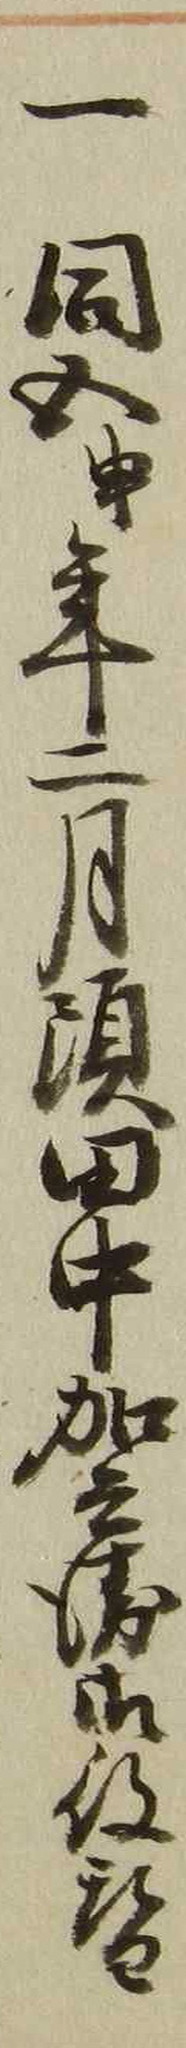一同五申年二月頭田中加兵衛御役替
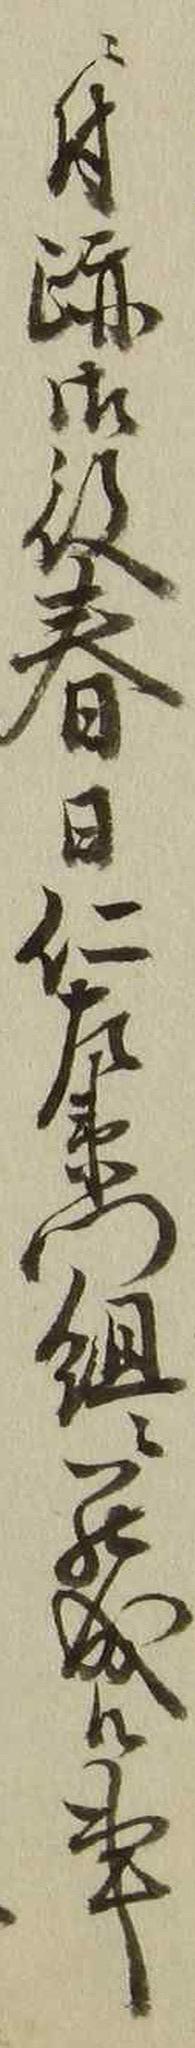ニ付跡御役春日仁左衛門組ニ罷成候事
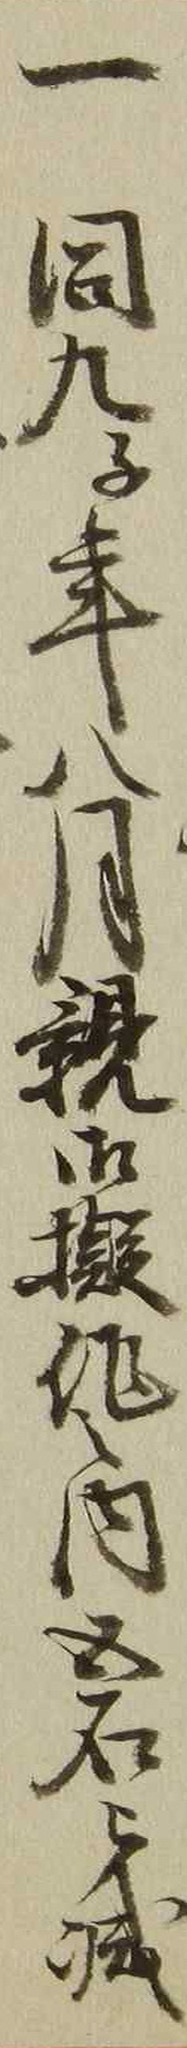一同九子年八月親御擬作之内五石被減
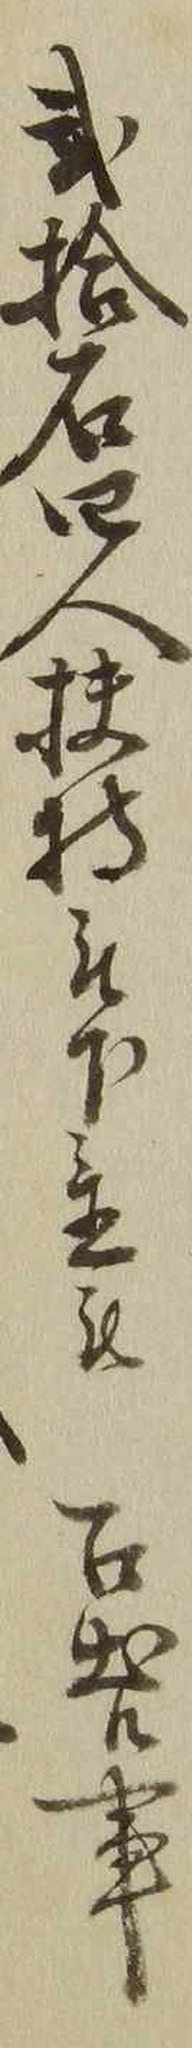弐拾石四人扶持被下置被召出候事
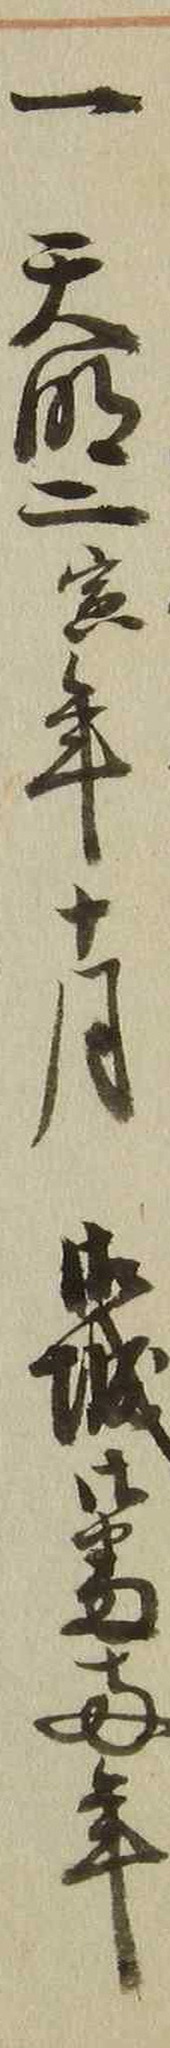一天明二寅年十月御城御番両年
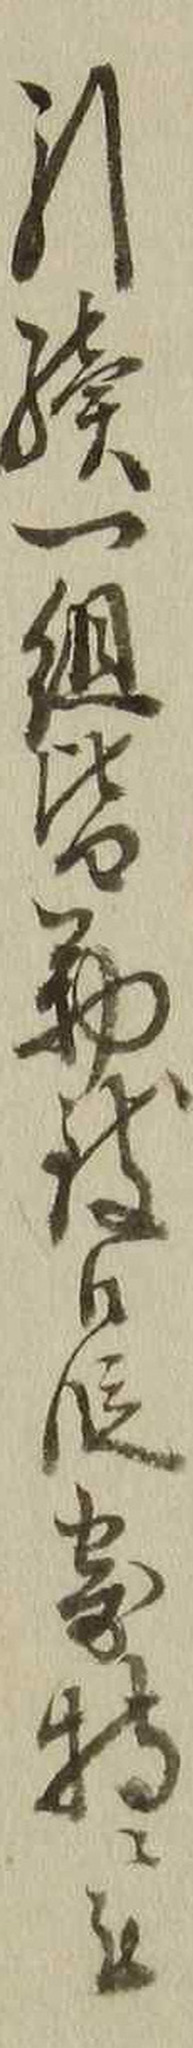引続一組皆勤致候趣奇特ニ被
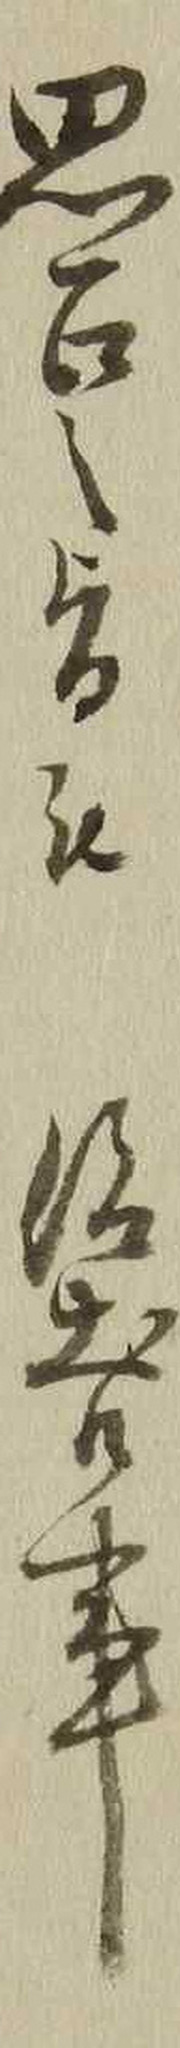思召之旨被仰出候事
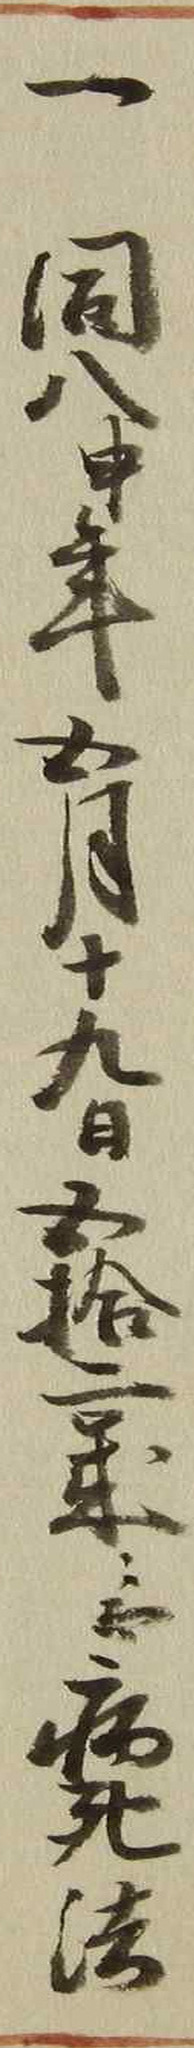一同八申年五月十九日五拾二歳ニ而病死法
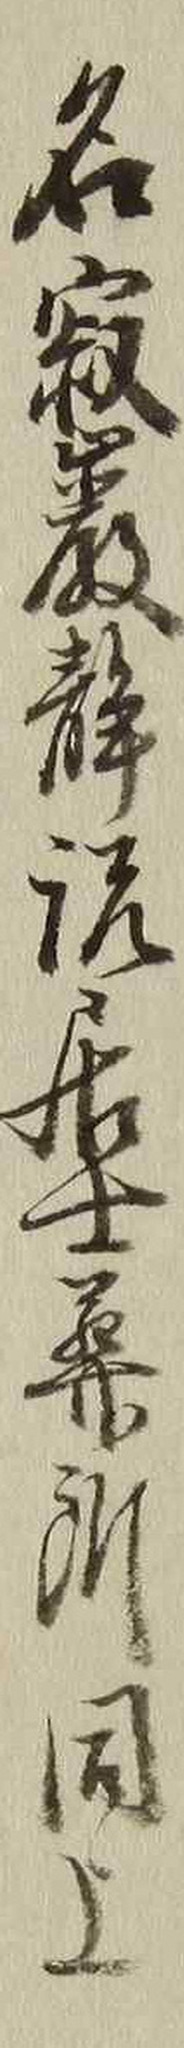名寂厳静説居士葬所同上
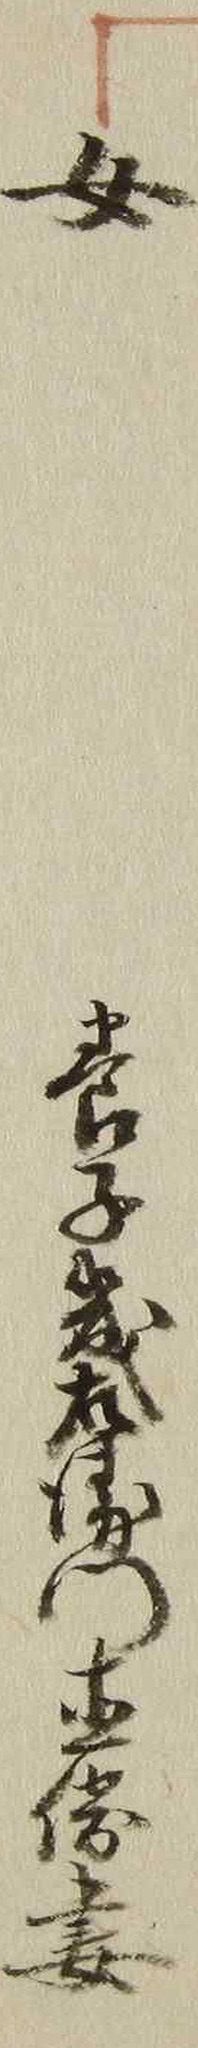女養子幾右衛門直衛妻
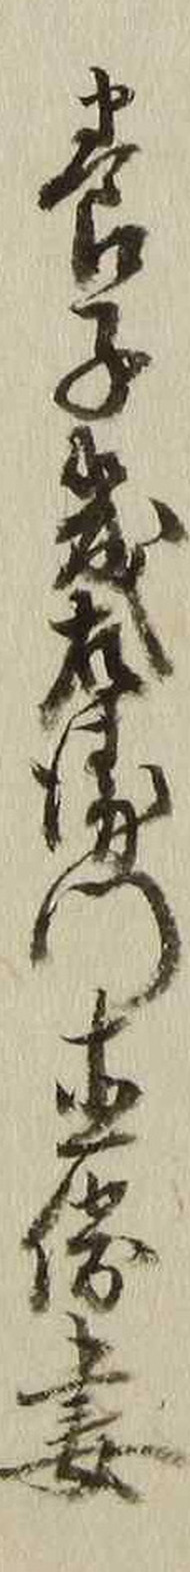女養子幾右衛門直衛妻
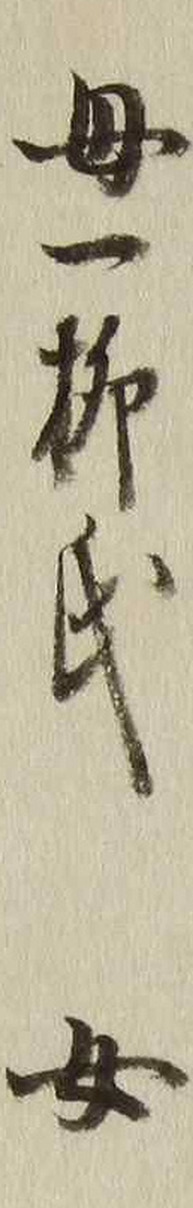母一柳氏女
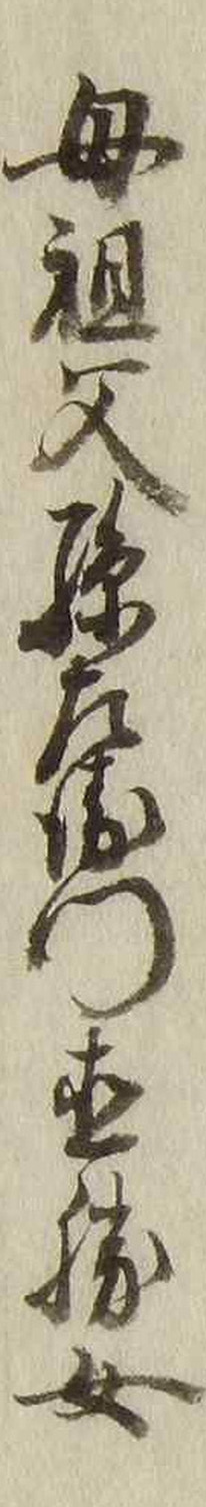母祖父孫左衛門直衛女
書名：諸士系譜　巻之53　に之部4
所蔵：会津若松市立会津図書館
